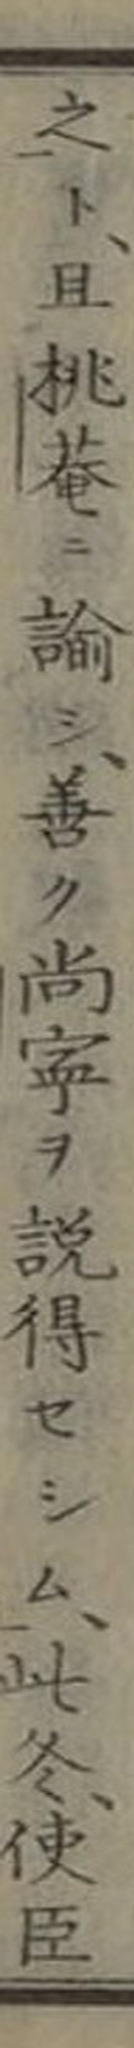之ト、且桃菴ニ諭シ、善ク尚寧ヲ説得セシム、」此冬、使臣
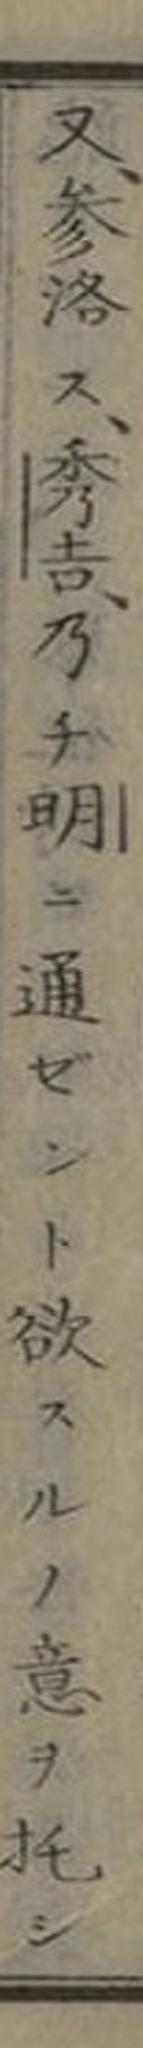又、参洛ス、秀吉、乃チ明ニ通ゼント欲スルノ意ヲ托シ

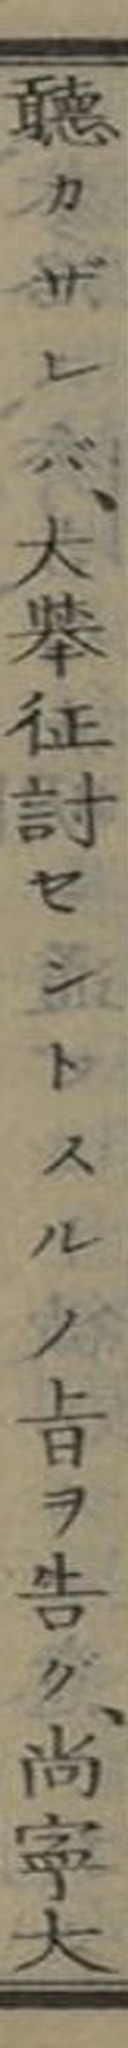聴カザレバ、大挙征討セントスルノ旨ヲ告グ、尚寧大
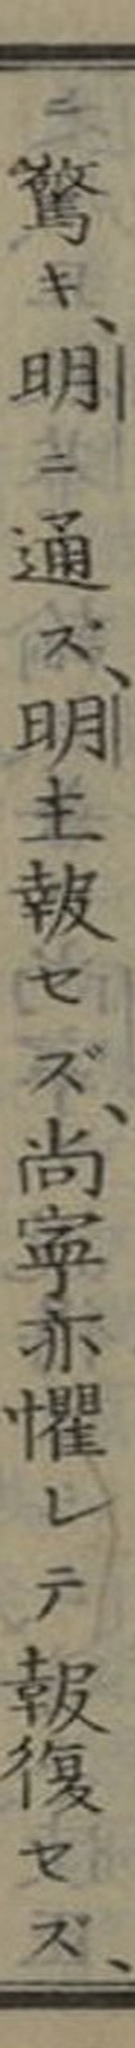ニ驚キ、明ニ通ズ、明主報セズ、尚寧亦懼レテ報復セズ、
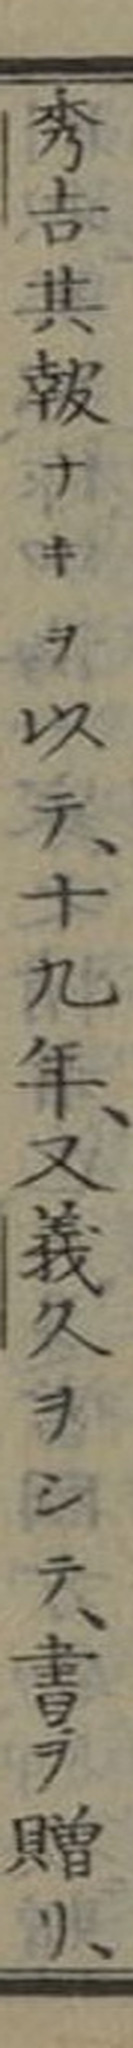秀吉其報ナキヲ以テ、十九年、又義久ヲシテ、書ヲ贈リ、
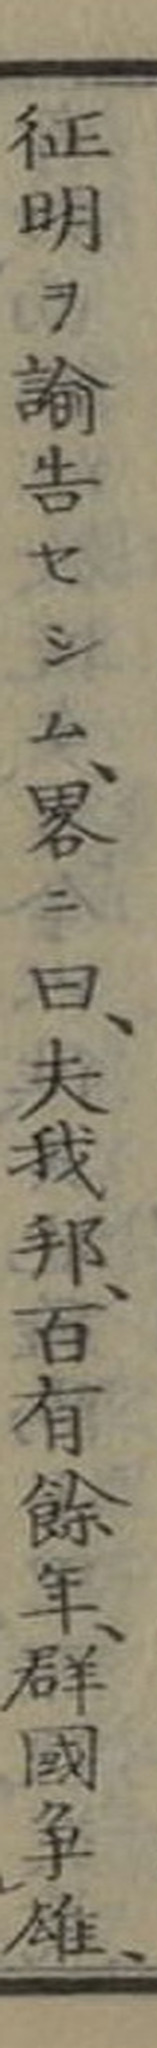征明ヲ諭告セシム、略ニ曰、夫我邦、百有余年、群国争雄、
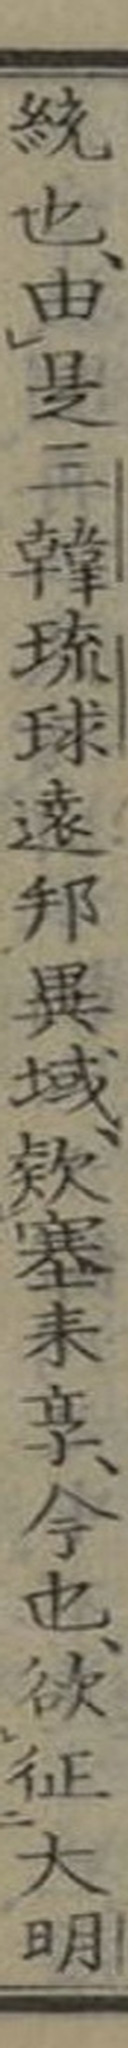統也、由是三韓琉球遠邦異域、欵塞来享、今也、欲征大明
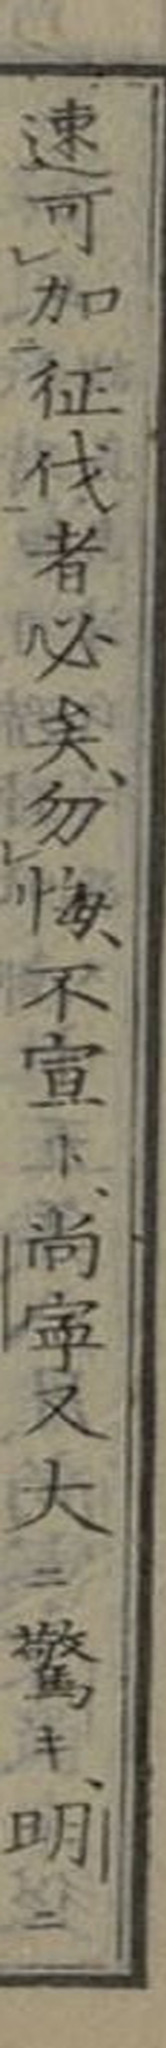速可加征伐者必矣、勿悔、不宣ト、尚寧又大ニ驚キ、明ニ
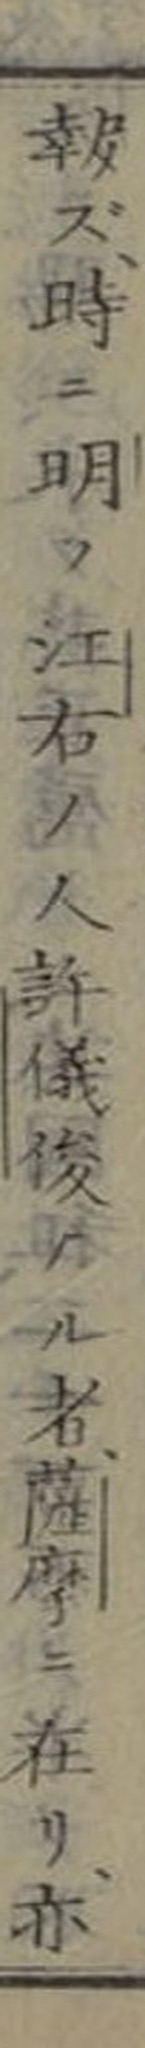報ズ、時ニ明ノ江右ノ人許儀俊ナル者、薩摩ニ在リ、亦
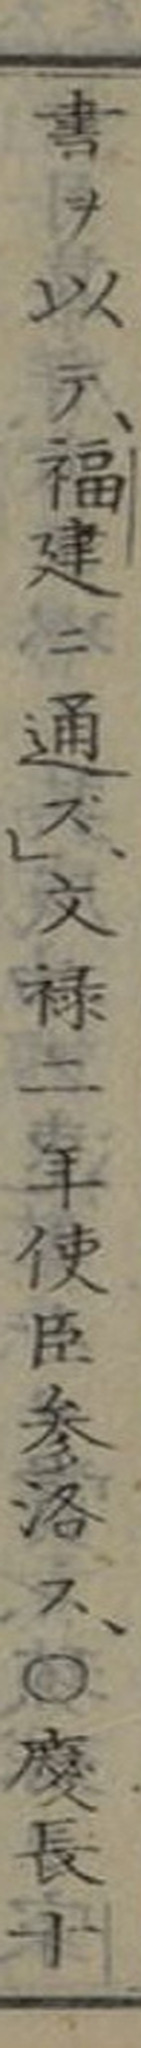書ヲ以テ、福建ニ通ズ、」文禄二年使臣参洛ス、○慶長十
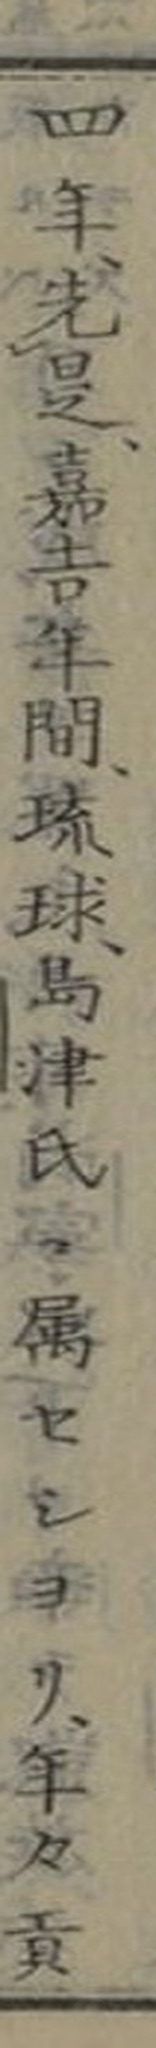四年、先是、嘉吉年間、琉球、島津氏ニ属セシヨリ、年々貢
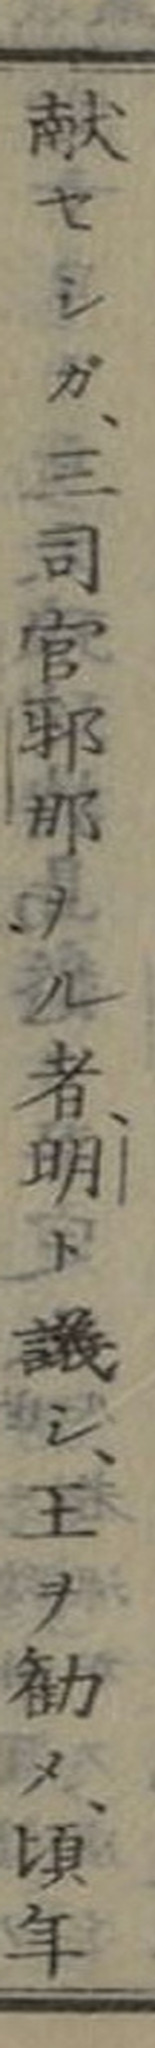献セシガ、三司官邪那ナル者、明ト議シ、王ヲ勧メ、頃年
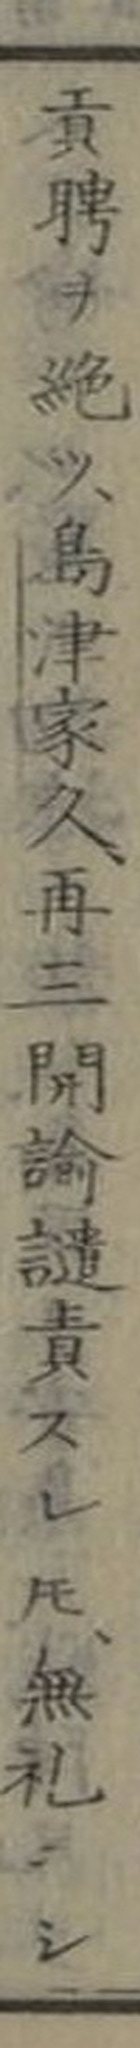貢聘ヲ絶ツ、島津家久、再三開諭譴責スレトモ、無礼ニシ
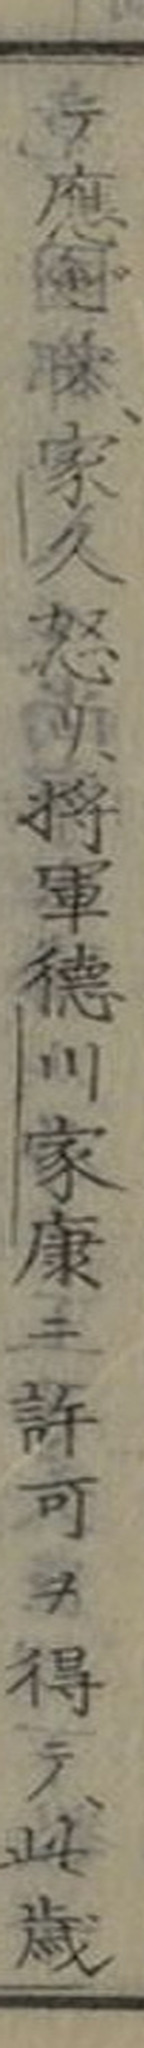テ応ゼズ、家久怒リ、将軍徳川家康ニ許可ヲ得テ、此歳
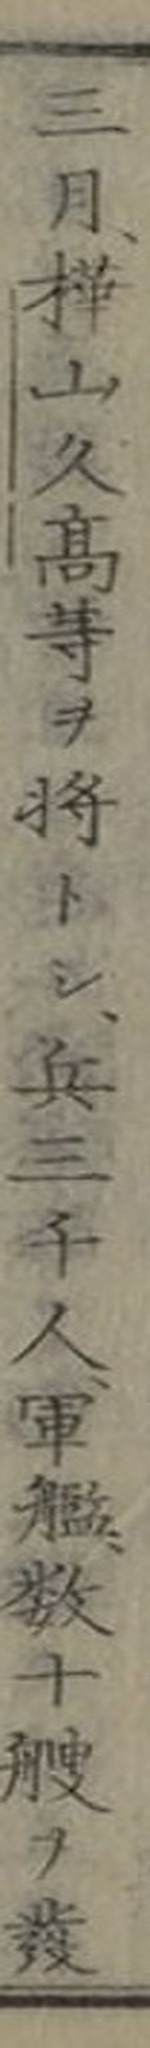三月、樺山久高等ヲ将トシ、兵三千人、軍艦、数十艘ヲ発
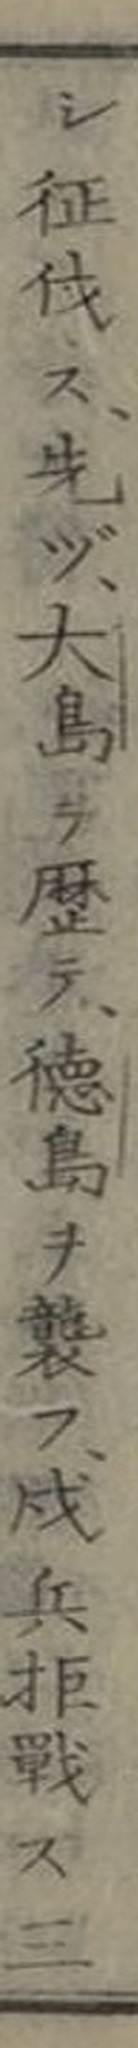シ征伐ス、先ヅ、大島ヲ歴テ、徳島ヲ襲フ、戍兵拒戦ス三
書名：琉球新誌 図附 上
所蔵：University of the Ryukyus Library
